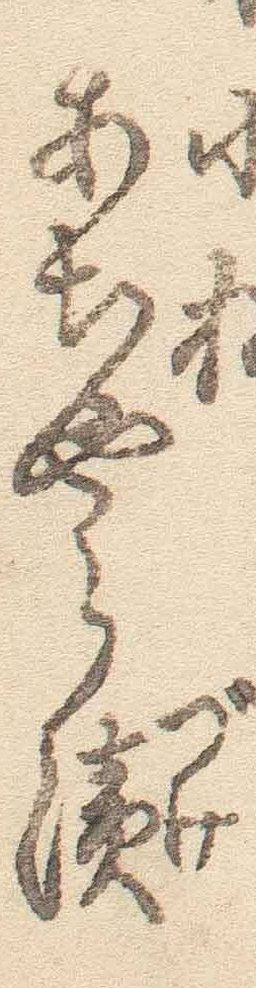あちやら漬

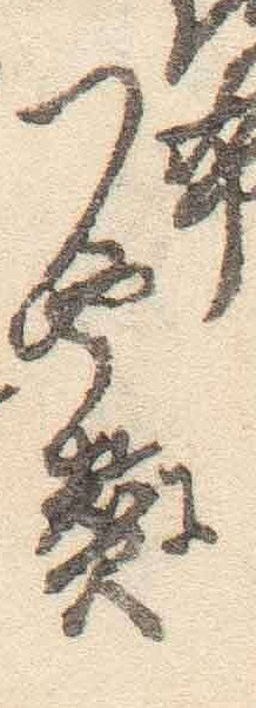つや煮
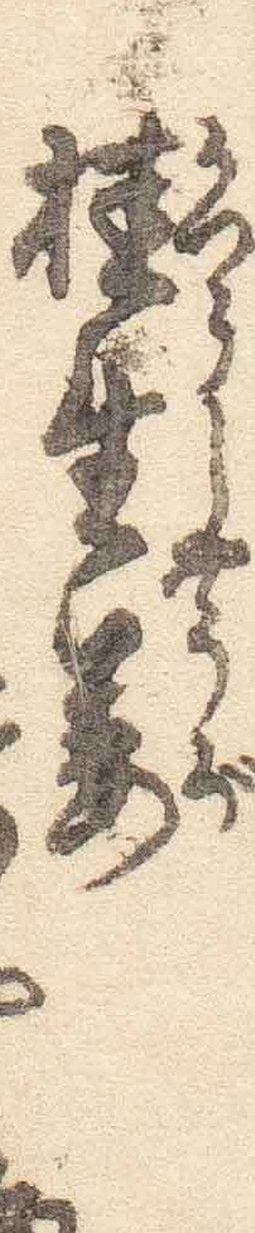植生姜
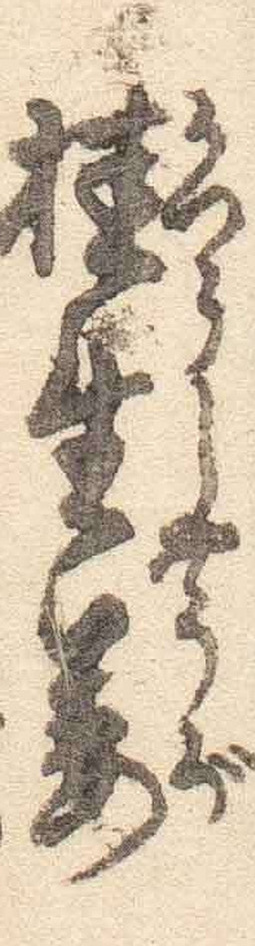植生姜
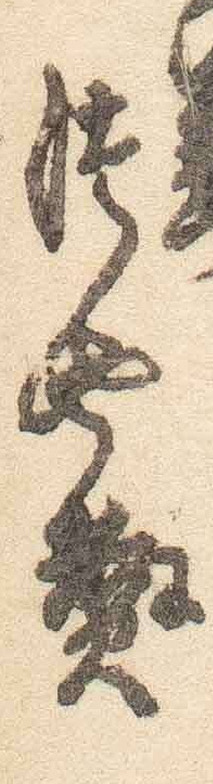つや煮
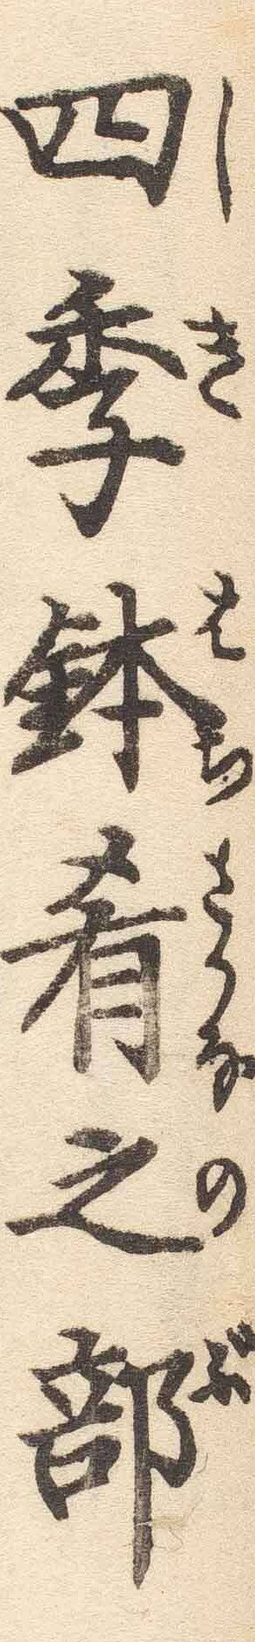四季鉢肴之部
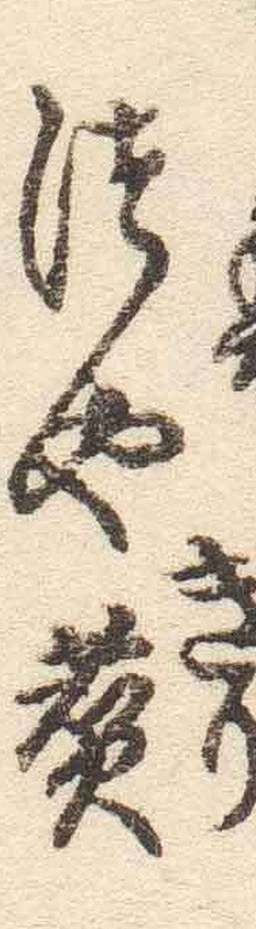つや煮
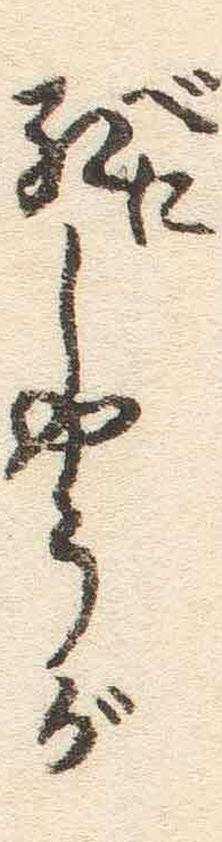紅しやうが
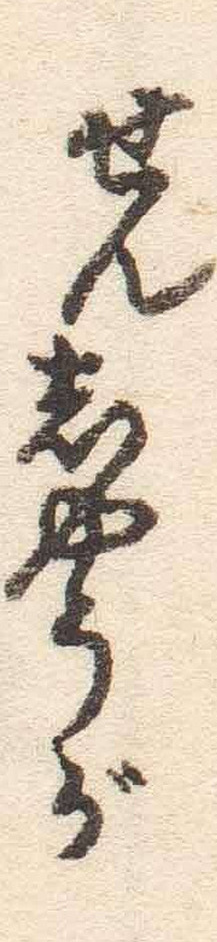紅しやうが
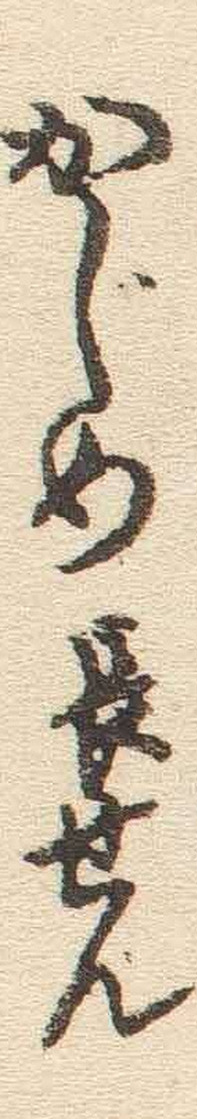かじめ長せん
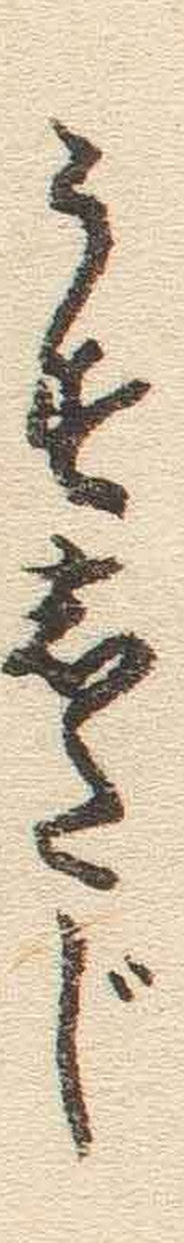うすしたじ
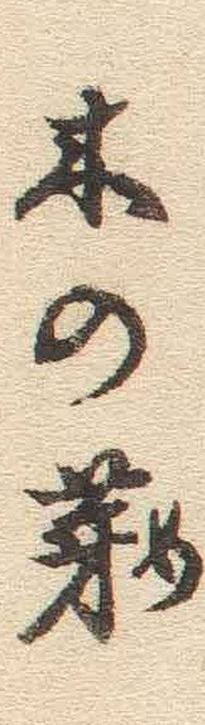木の芽

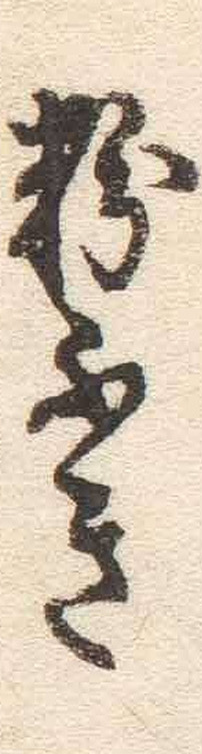粉ふき
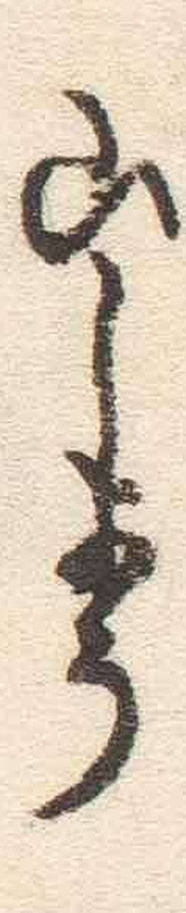山しよう
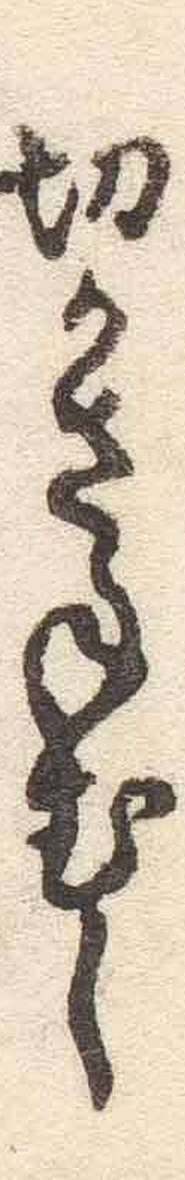きり切かさねむし
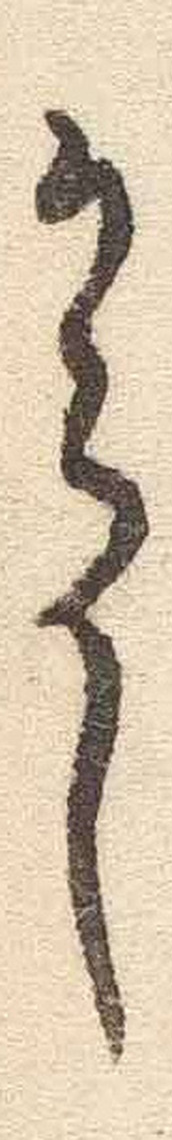からし
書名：料理通
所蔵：東京学芸大学附属図書館 国文学研究資料館
